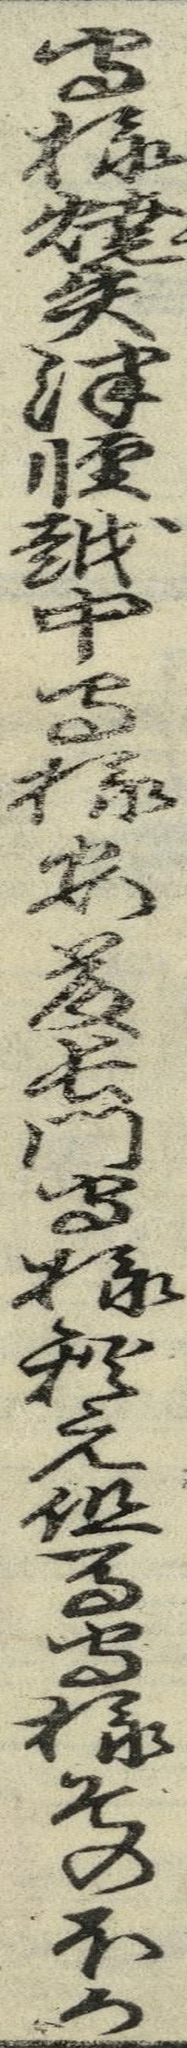守様燒失津軽越中守様安藤長門守様秋元但馬守様そのほか

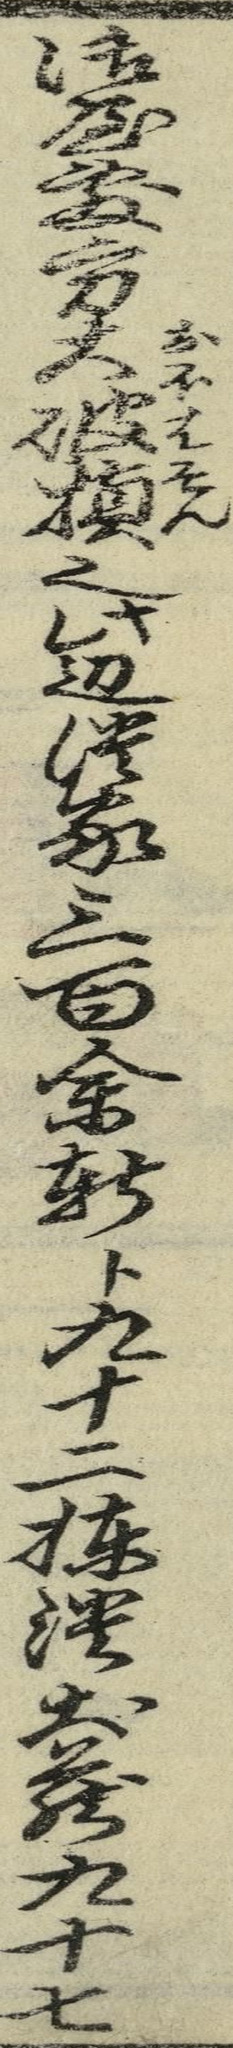御屋敷方大破損也此辺潰家三百余軒ト九十二棟潰土蔵九十七
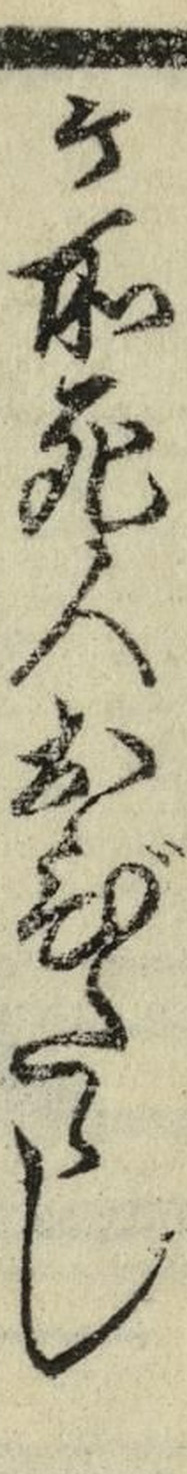ケ所死人おびたゝし
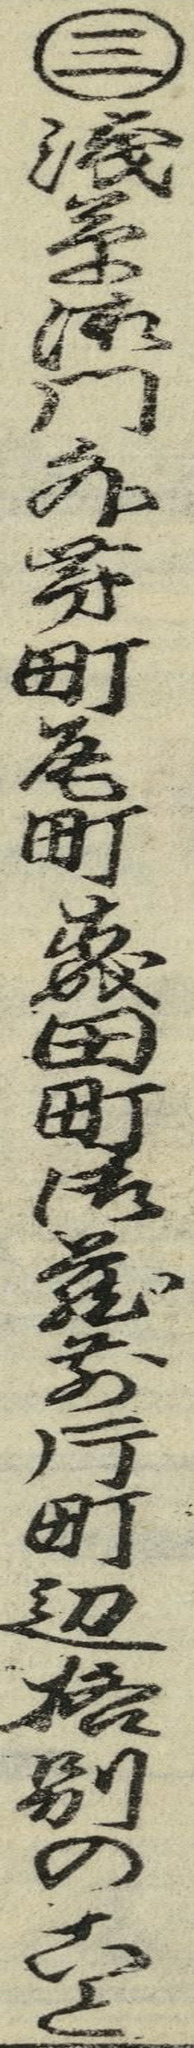㊂浅草御門外茅町瓦町森田町御蔵前片町辺格別のこと
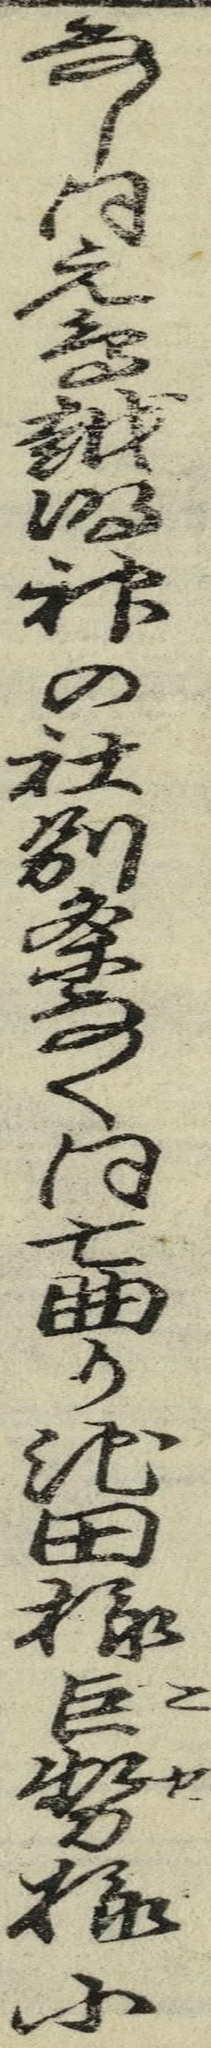なし同元鳥越明神の社別条なく同七曲り池田様巨勢様小
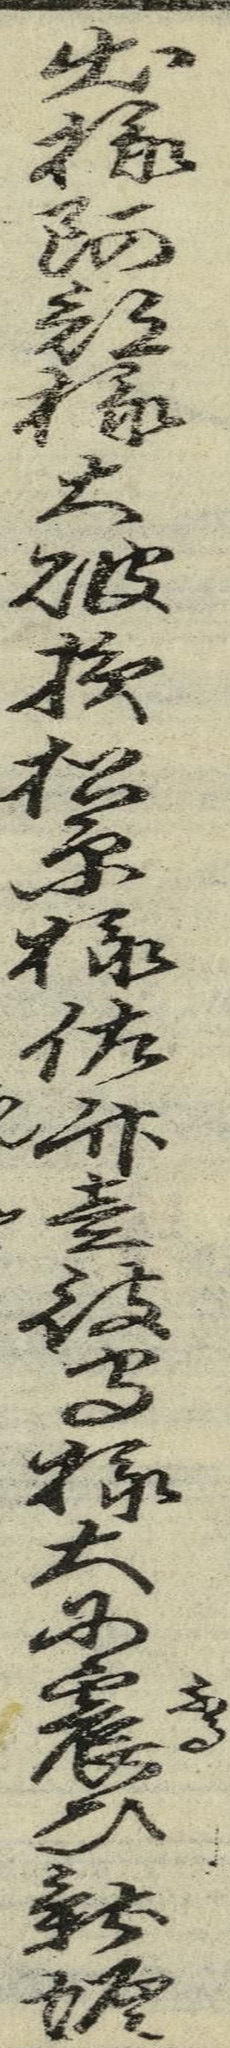出様阿部様大破損松原様佐竹壱岐守様大に震ひ新堀
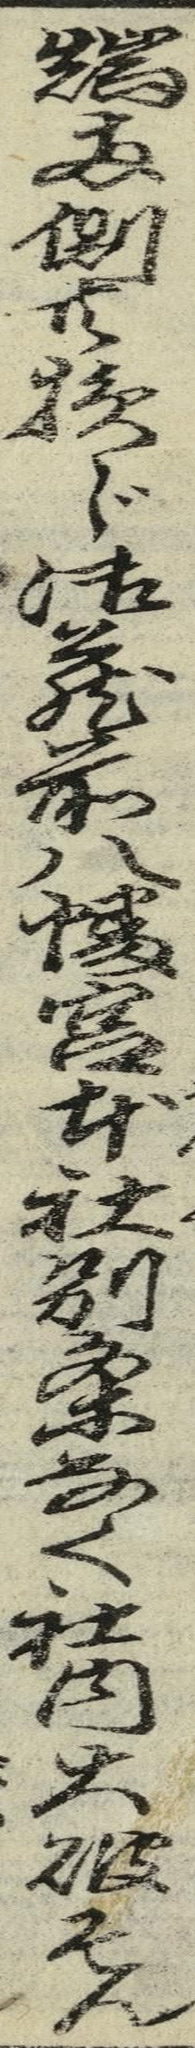端両側共損じ御蔵前八幡宮本社別条なく社内大破そん
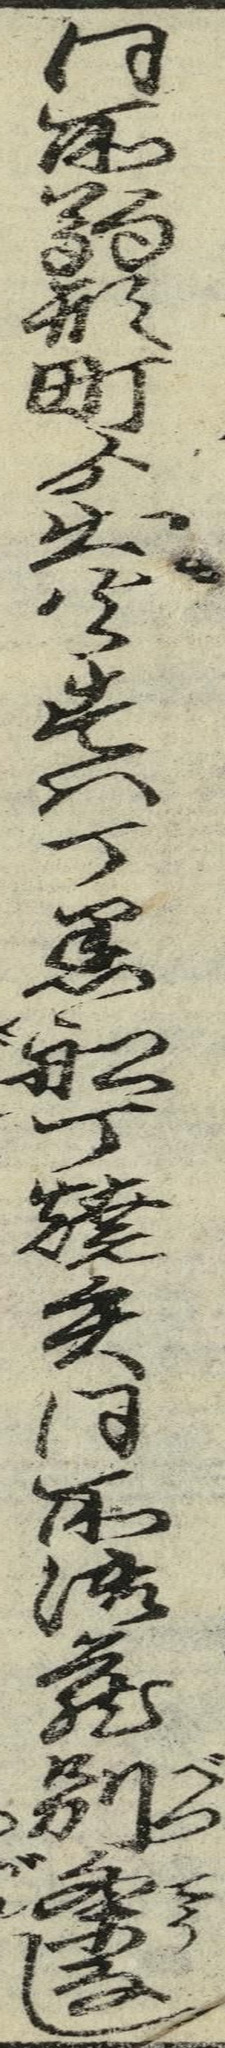同所駒形町ゟ出火すは丁黒舩丁焼失同所御蔵別条なし
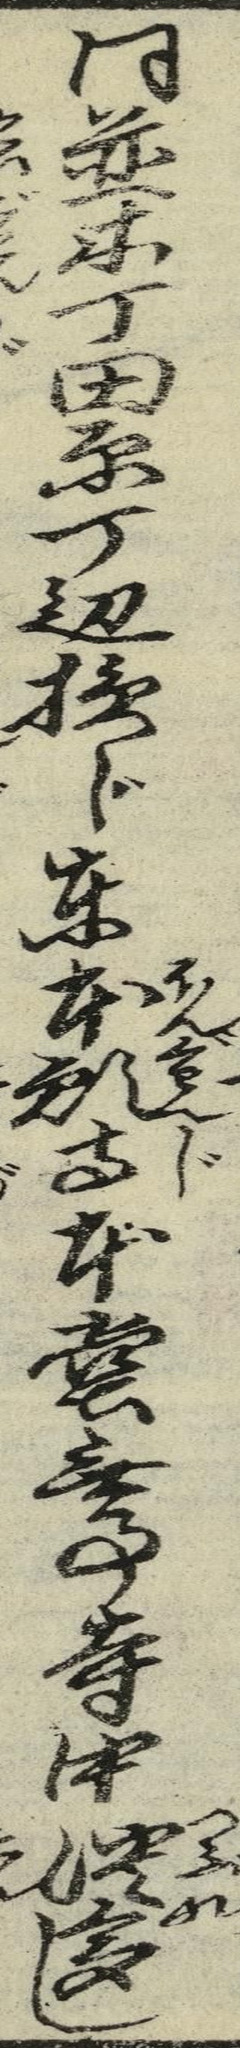同並木丁田原丁辺損じ東本願寺本堂無事寺中潰多し
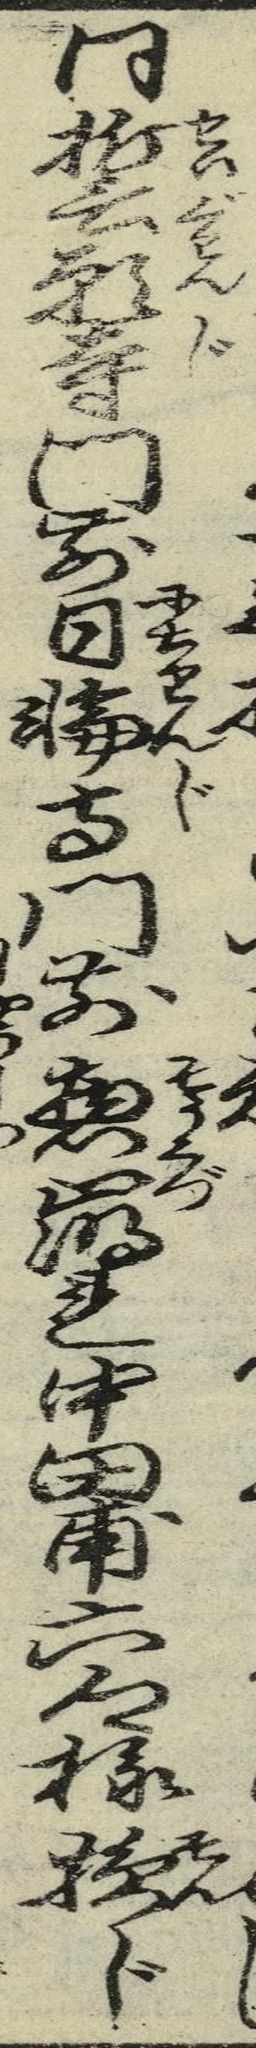同誓願寺門前日輪寺門前惣崩れ中田甫六郷様損じ
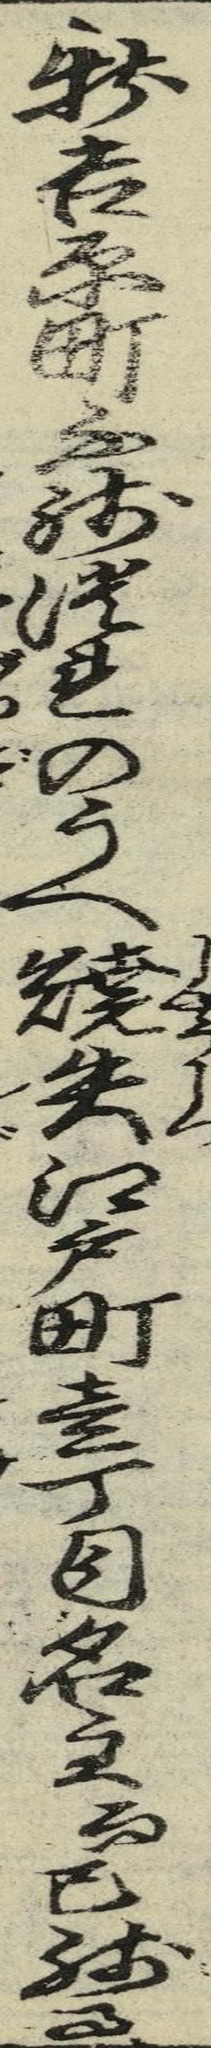新吉原町不残潰れのうへ焼失江戸町壱丁目名主而已残る
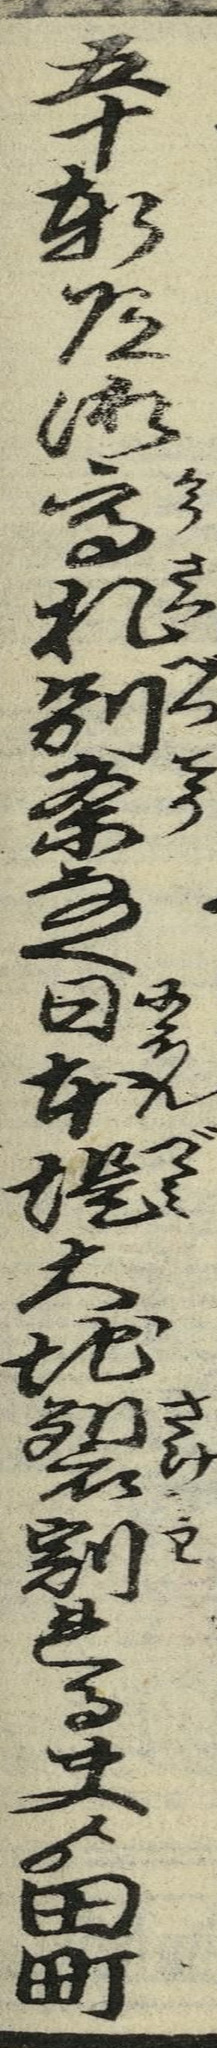五十軒道御高札別条なく日本堤大地裂割れる夫ゟ田町
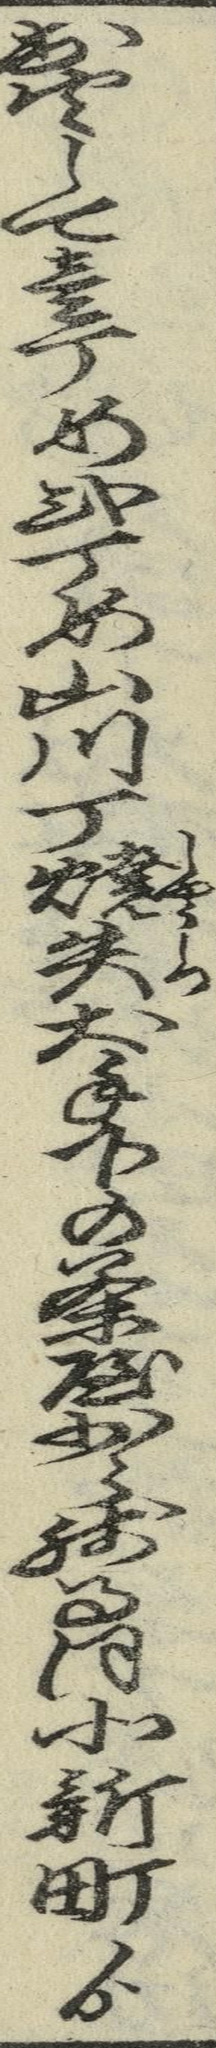出火して壱丁め弐丁め山川丁焼失大手下の茶屋少々残る同北新町ゟ
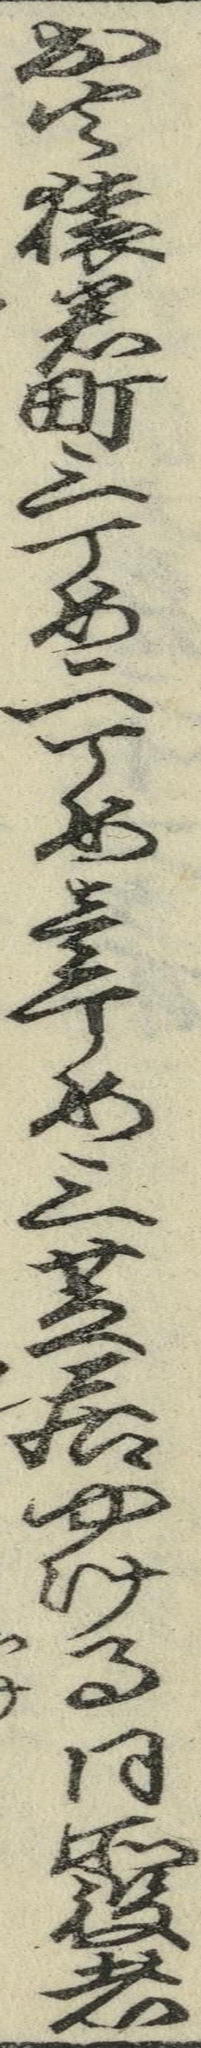出火猿若町三丁め二丁め壱丁め三芝居やける同所役者
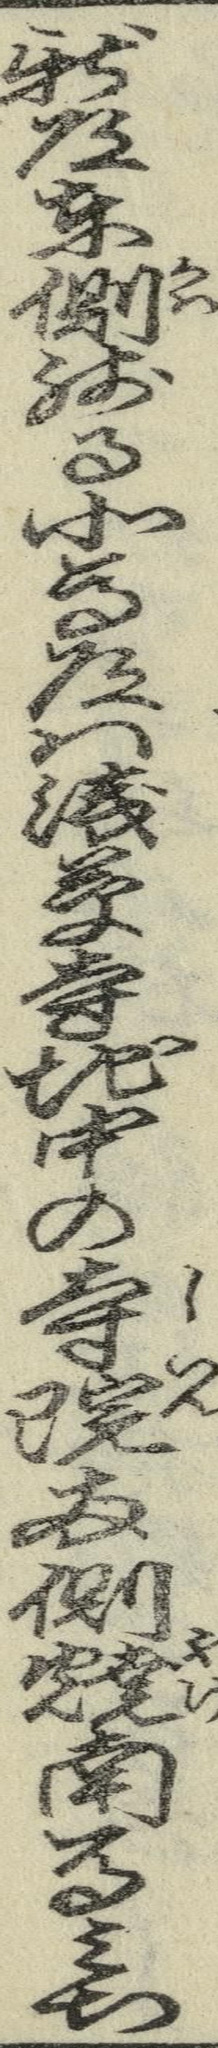新道東側残る北馬道は浅草寺地中の寺院両側焼南馬みち
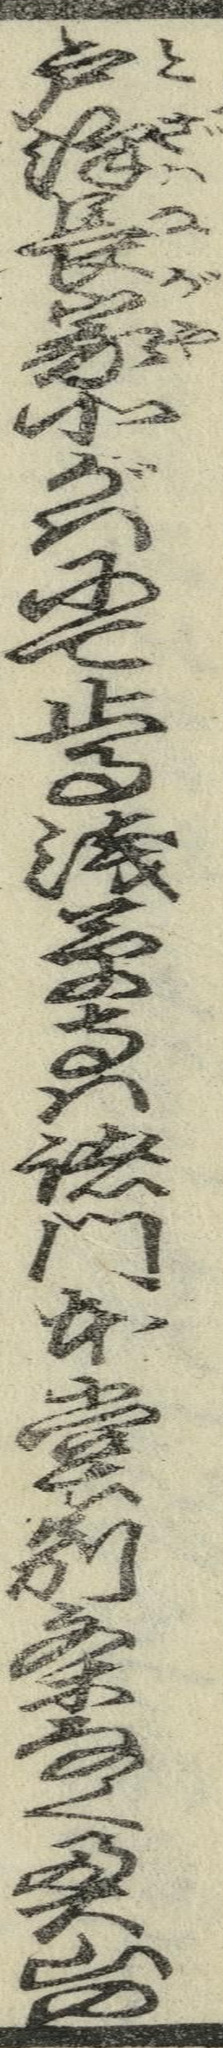戸澤長家北がはにて止る浅草寺は諸門本堂別条なく奥山の
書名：地震年代記
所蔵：東京大学地震研究所図書室 Earthquake Research Institute Library, The University of Tokyo, JAPAN
